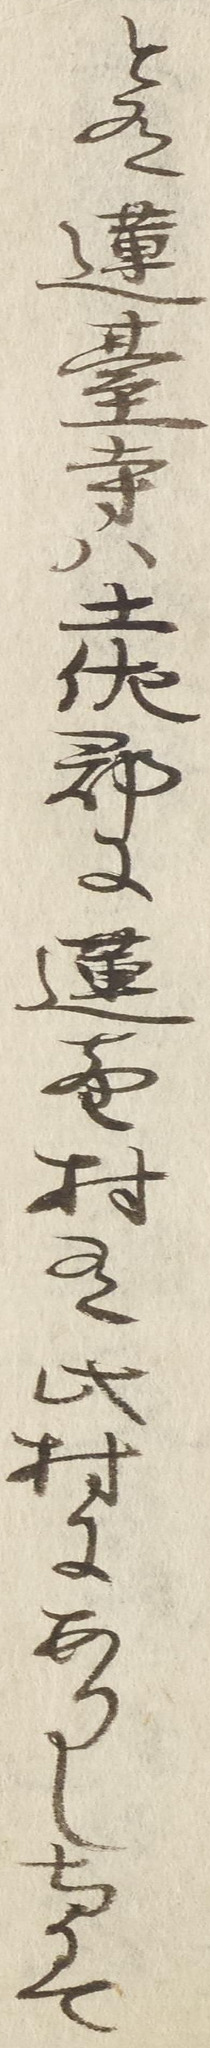と有蓮台寺は土佐郡に蓮台村有此村にありし寺にて
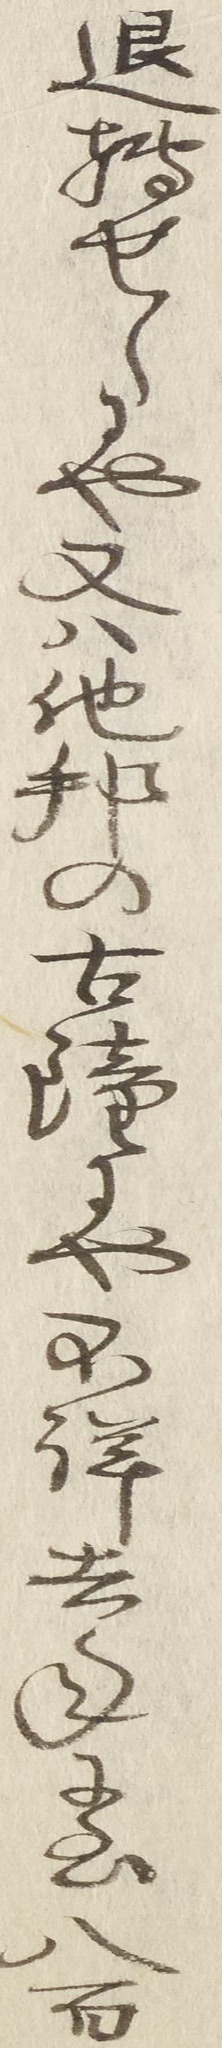退転せしにや又は他邦の古鐘にや不詳去年に至八百
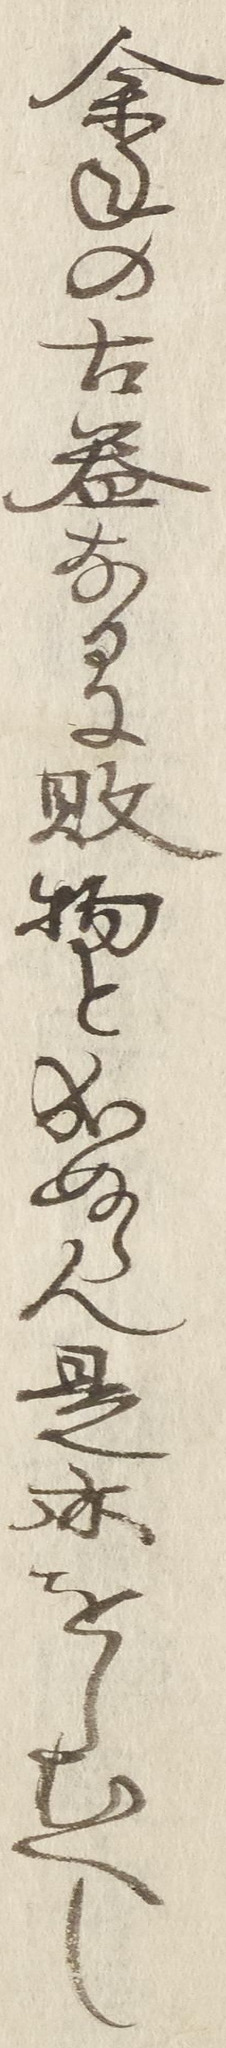余年の古器なるに敗物と成ぬらん是亦をしむへし
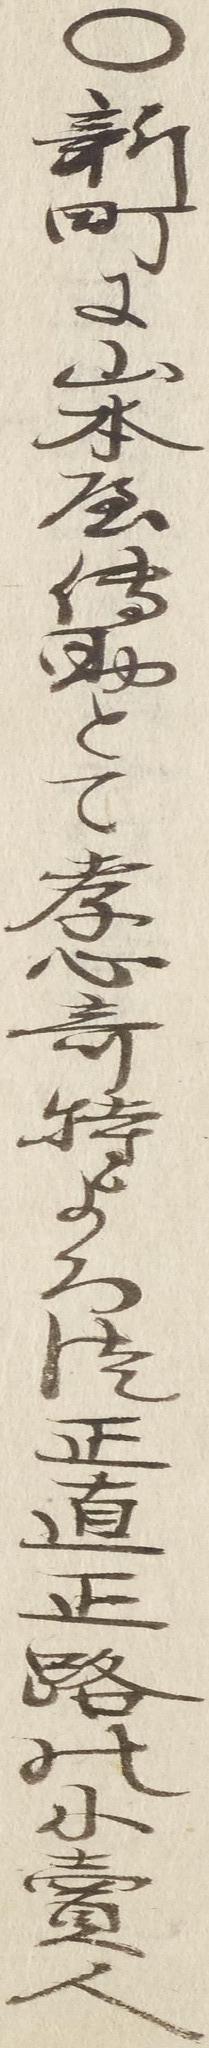○新町に山本屋伝助とて孝心奇特よろす正直正路の小売人
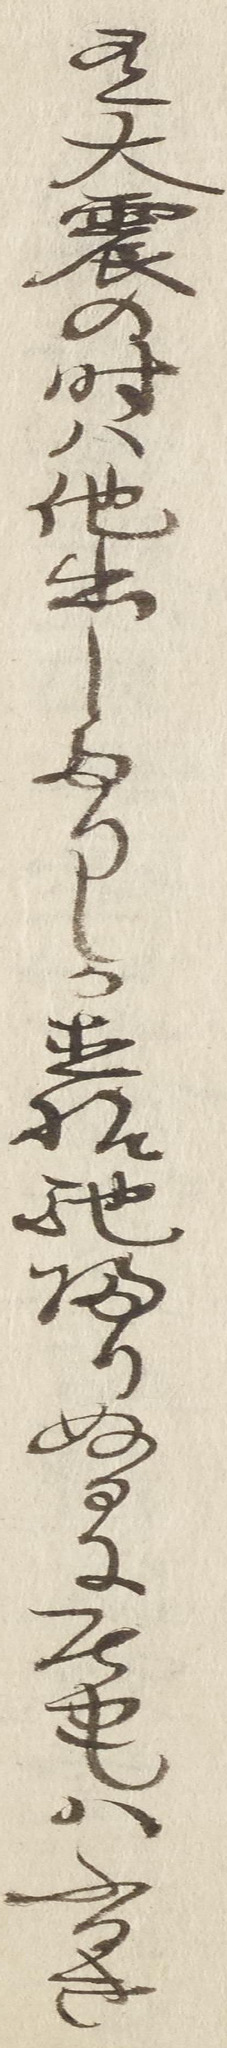有大震の時は他出したりしか直様馳帰りぬるに居宅はふるき
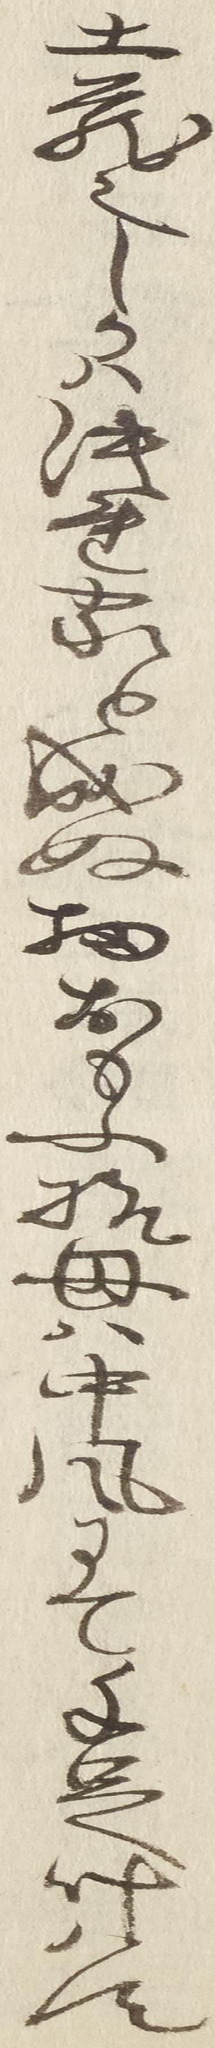土蔵成しかは潰れ家と成ぬ扨おもふ様母は中風にて手足叶はす
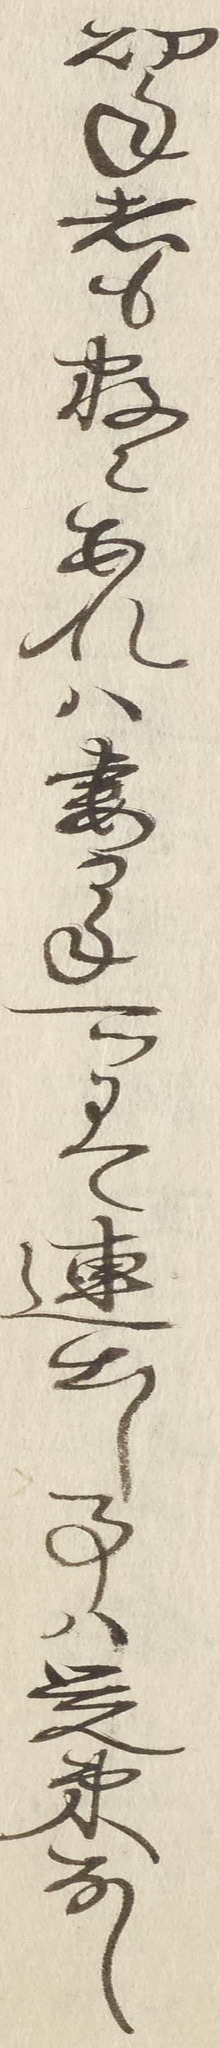幼年者も数々あれは妻か手一ッにて連出し事は覚束なし
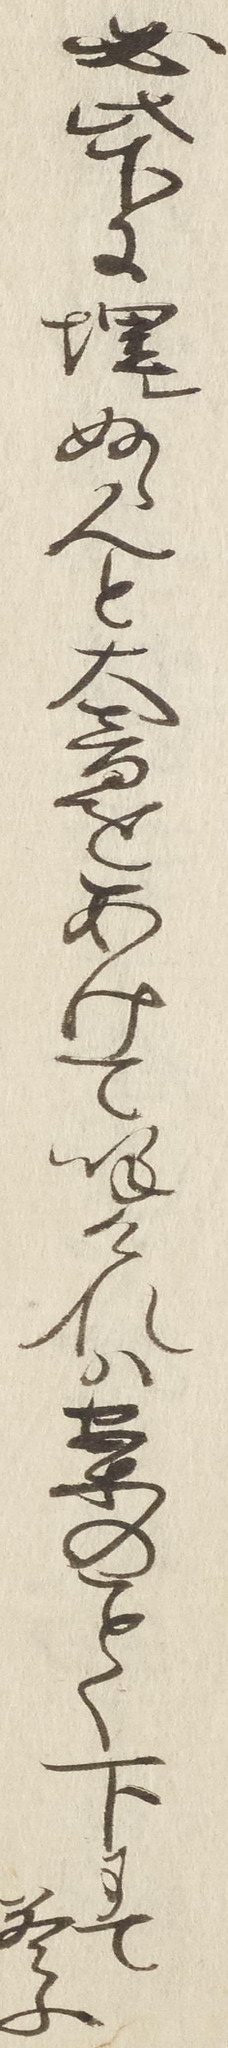必此の下に埋ぬらんと大音をあけて呼けれは案のことく下にて答ふ
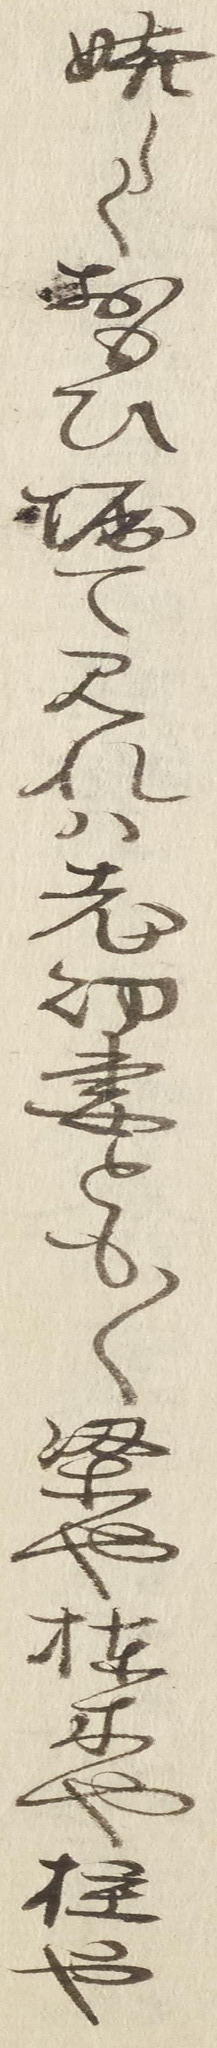嬉しくおもひ掘て見れは老幼妻とも〳〵梁や棟木や柱や
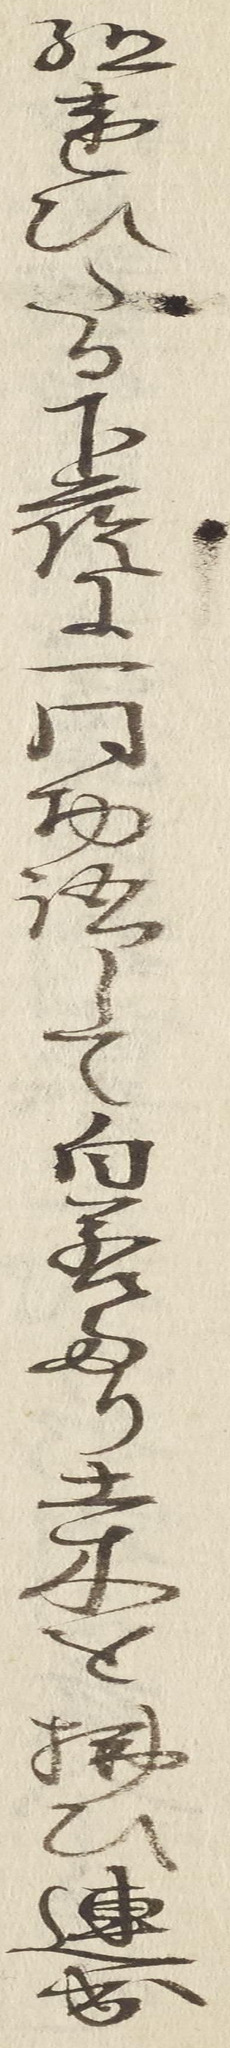組建ひたる下蔵に一同物語して自若たり土木を拂ひ連出
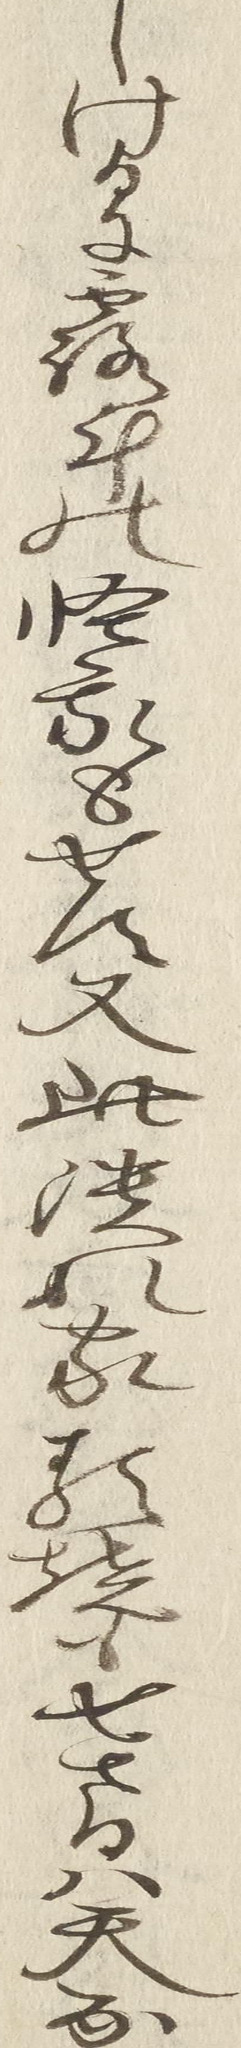しけるに露計の怪我もせす又此潰れ家類焼もせさるは天な
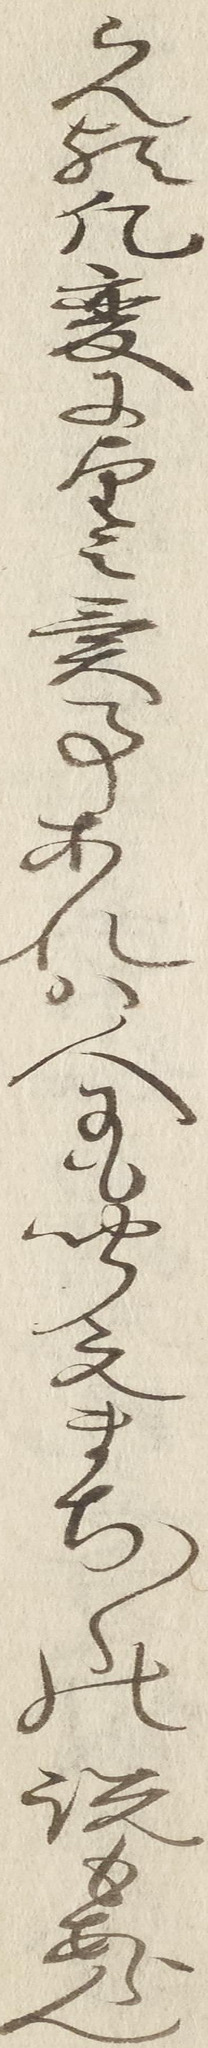らん歟凡変に望み異事あれは人にも聞えまち〳〵の説もあらん
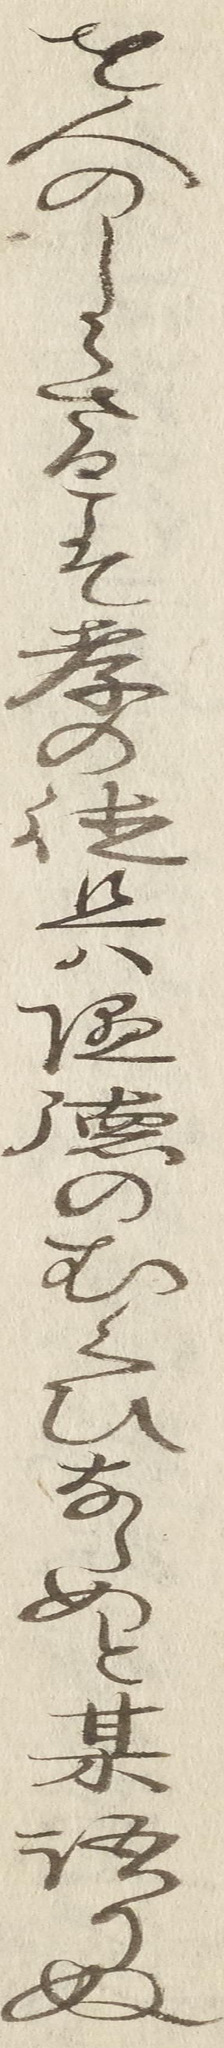を人のしらさるにて孝の徳且は隠徳のむくひならめと某語りぬ
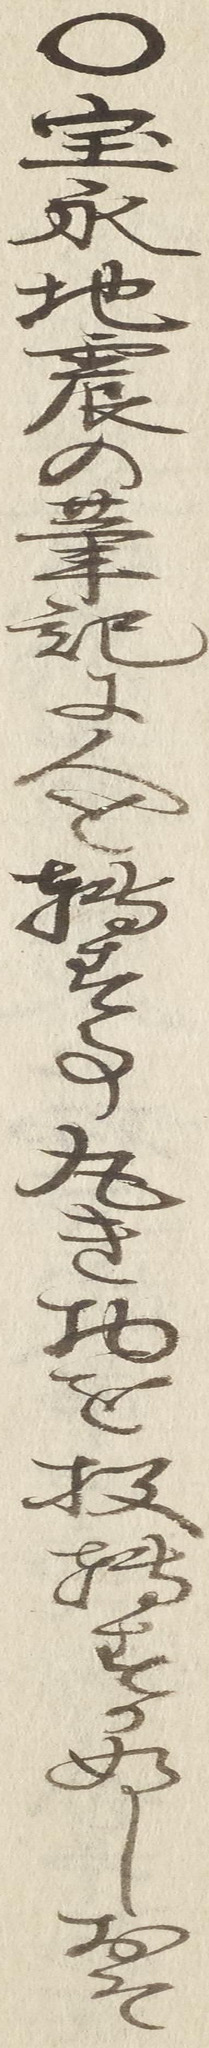○宝永地震の筆記に人を転す事丸き物を投転すか如しおそ
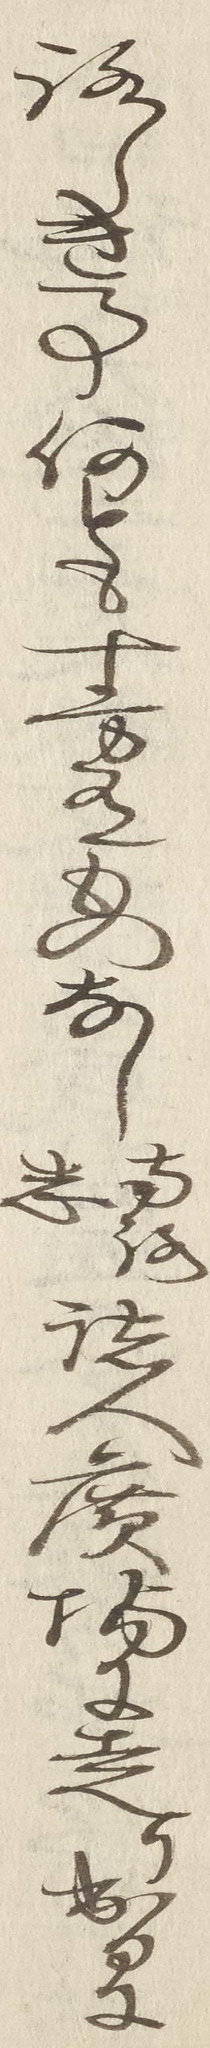ろしき事何とも十方有ものなし南路志諸人広場に走り出るに
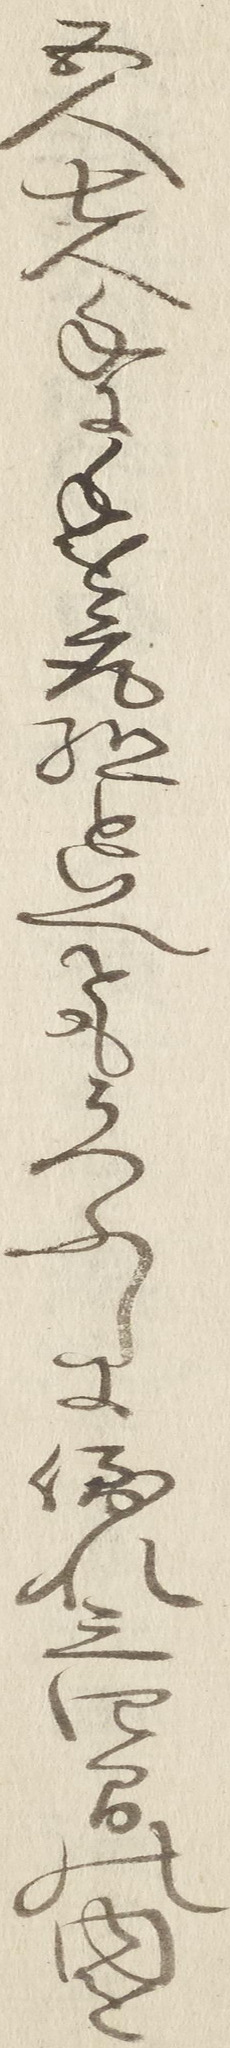五人七人手に手を取組といへともうつふしに倒れ三四間の内を
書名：地震記　上
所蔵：東京大学地震研究所図書室 Earthquake Research Institute Library, The University of Tokyo, JAPAN
